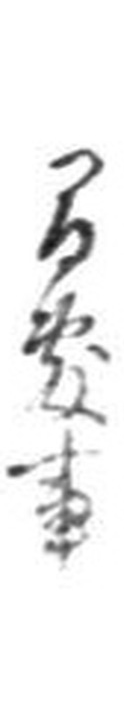間敷事
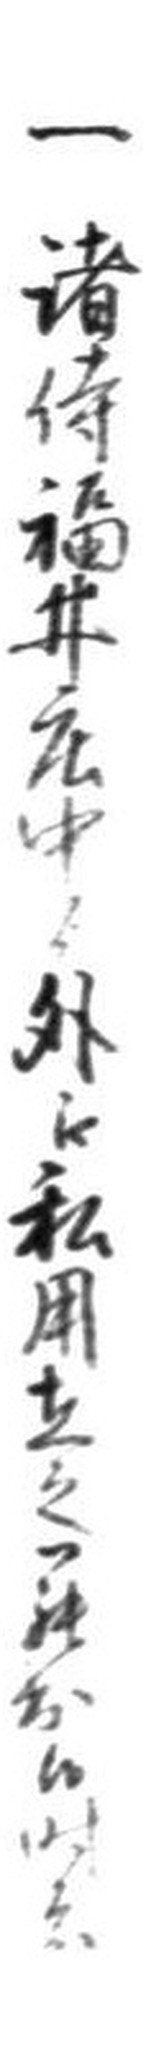一諸侍福井庄中ゟ外江私用在之罷出候時は
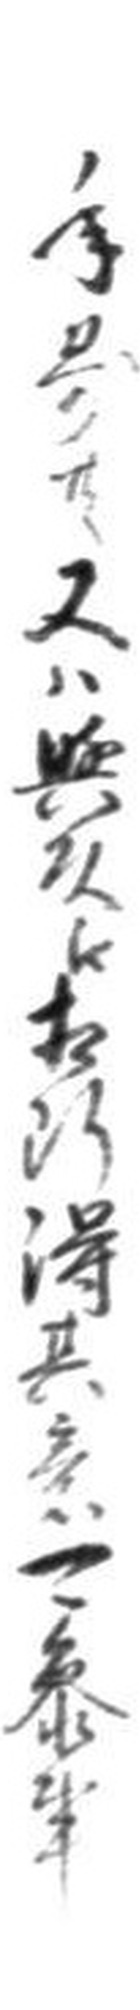年寄共又ハ與頭江相断得其意可参事
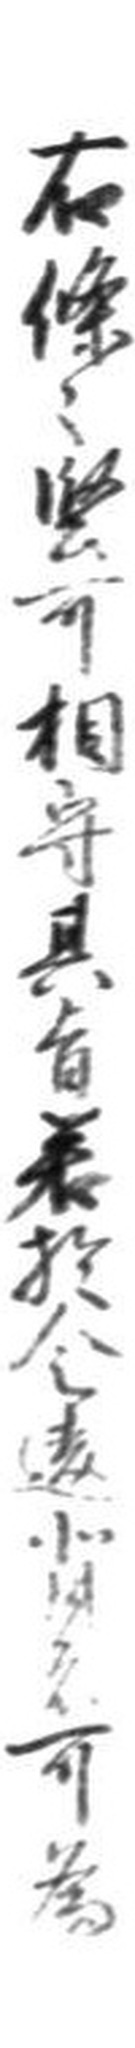右条々堅可相守其旨若於令違背者可為
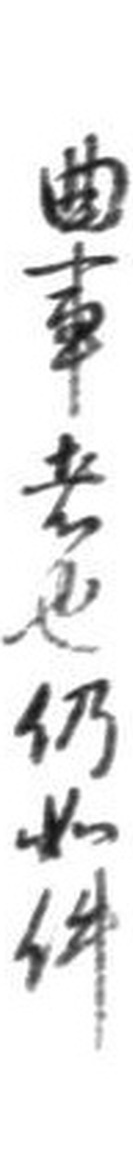曲事者也仍如件
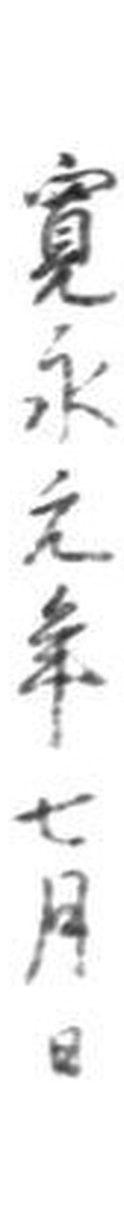寛永元年七月日

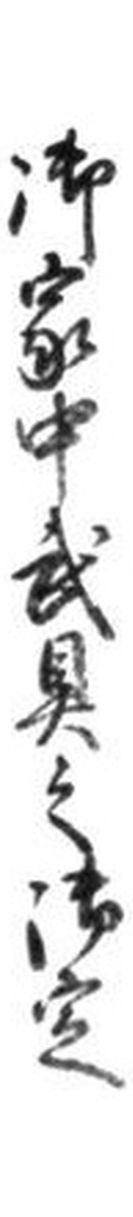御家中武具之御定
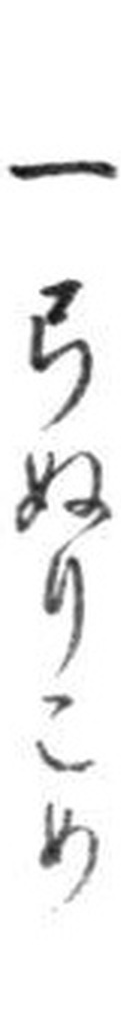一弓ぬりこめ
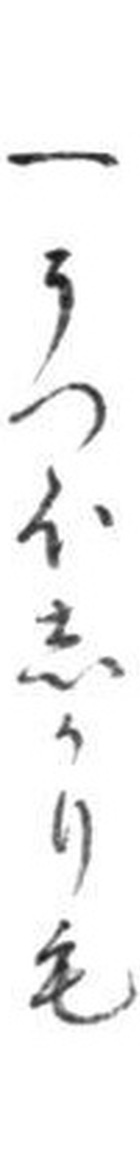一うつほしかり毛
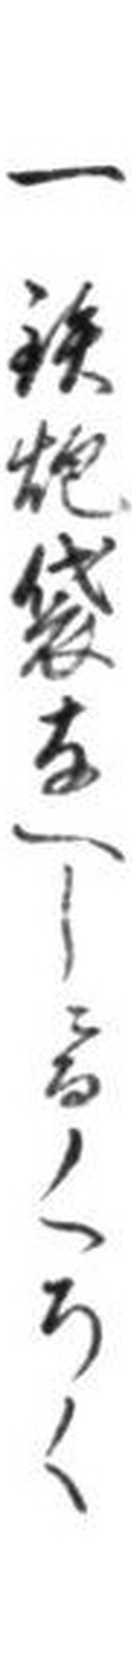一鉄炮袋なへしニ而くろく
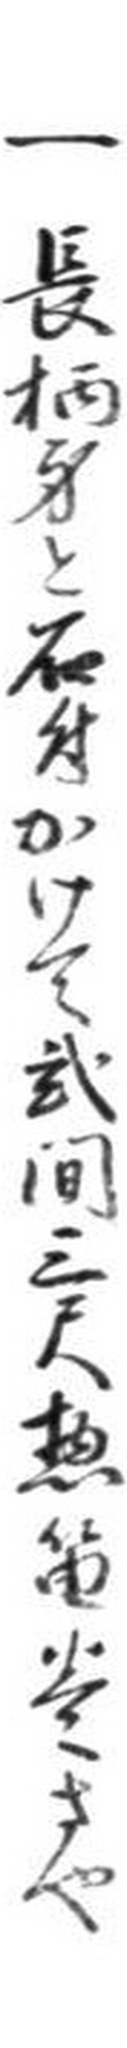一長柄身と石付かけて弐間三尺惣笛巻さや
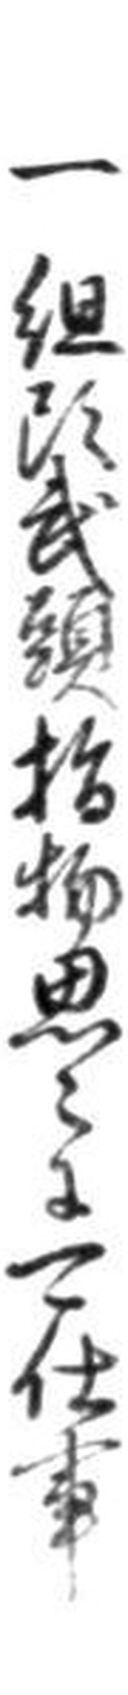一組頭武頭指物思々に可仕事
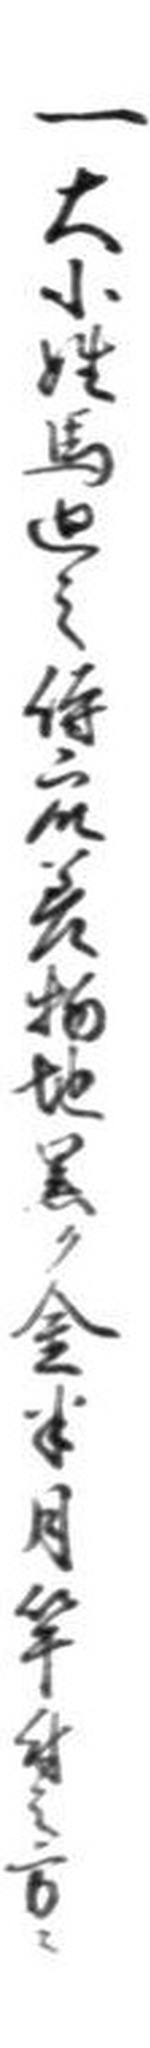一大小姓馬廻之侍衆差物地黒ク金半月竿付之方ニ
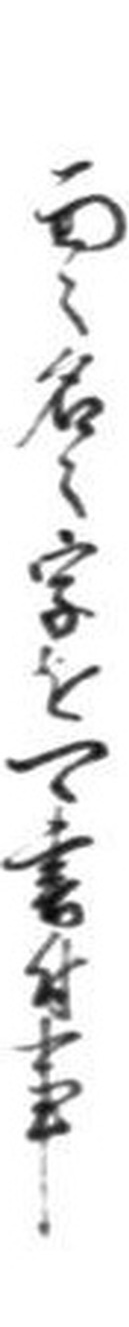面々名々字を可書付事
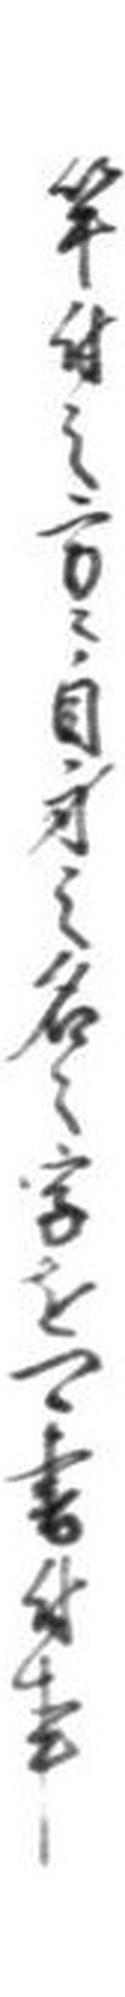竿付之方ニ自身之名々字を可書付事
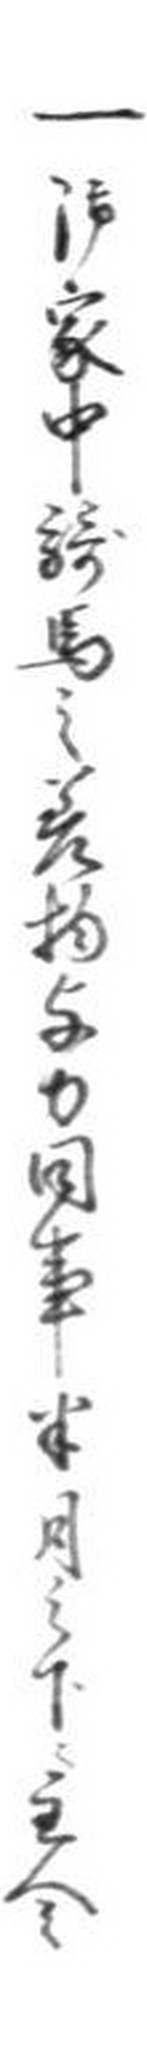一御家中騎馬之差物与力同事半月之下ニ主人之
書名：家譜 三 忠昌公 従慶長八年到寛永六年
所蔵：福井県文書館 Fukui Prefectural Archives
